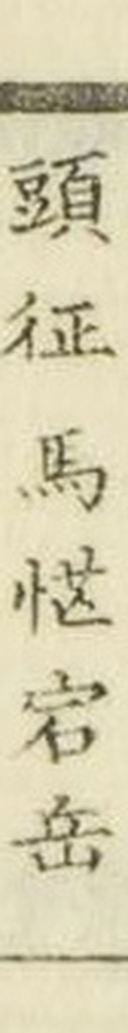頭征馬恾宕岳
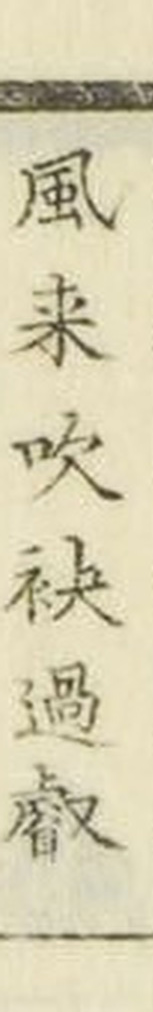風来吹袂過叡
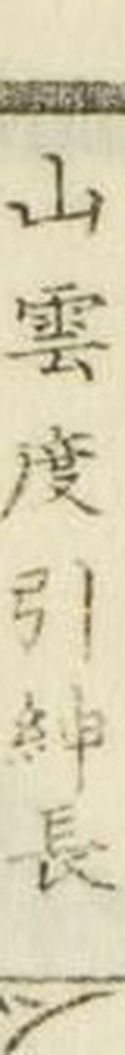山雲度引紳長
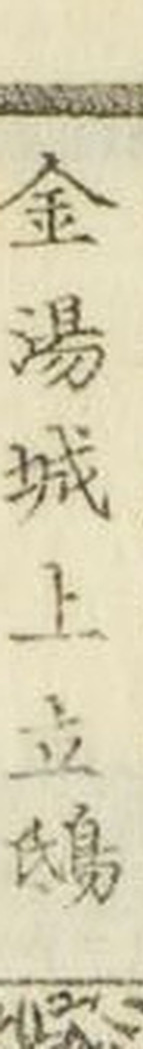金湯城上立鴟
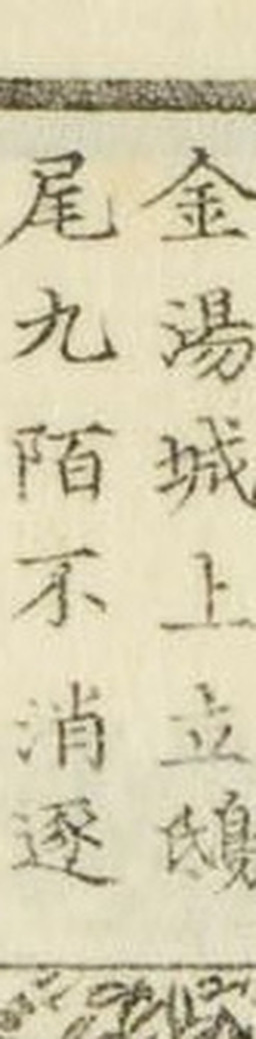尾九陌不消逐
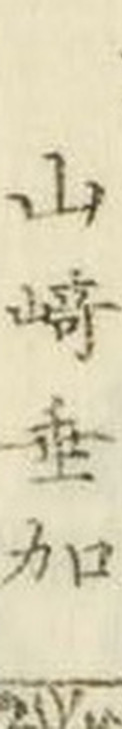山崎垂加

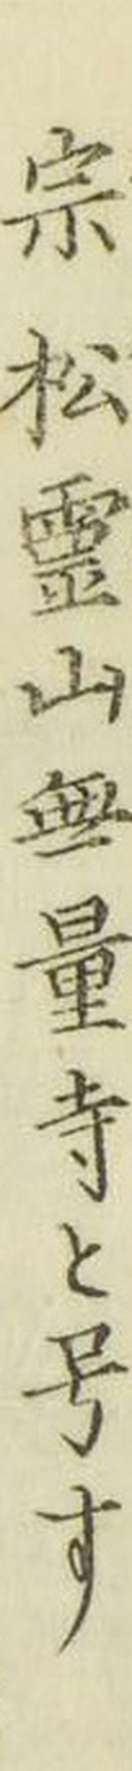宗松霊山無量寺と号す
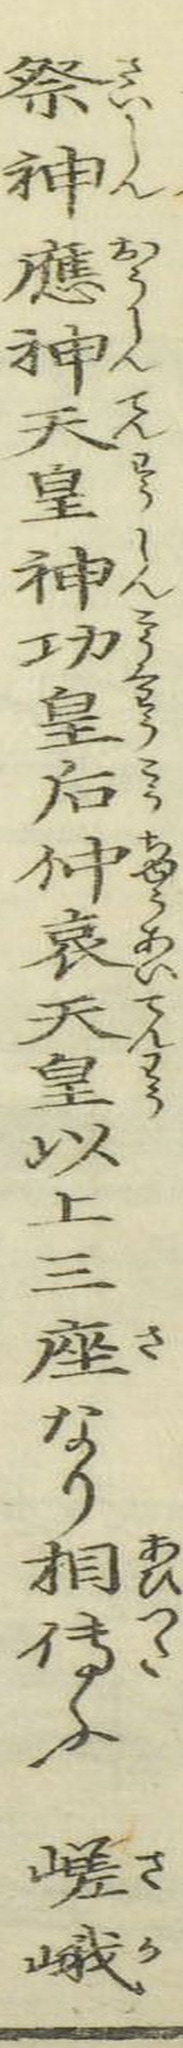祭神応神天皇神功皇后仲哀天皇以上三座なり相伝ふ嵯峨
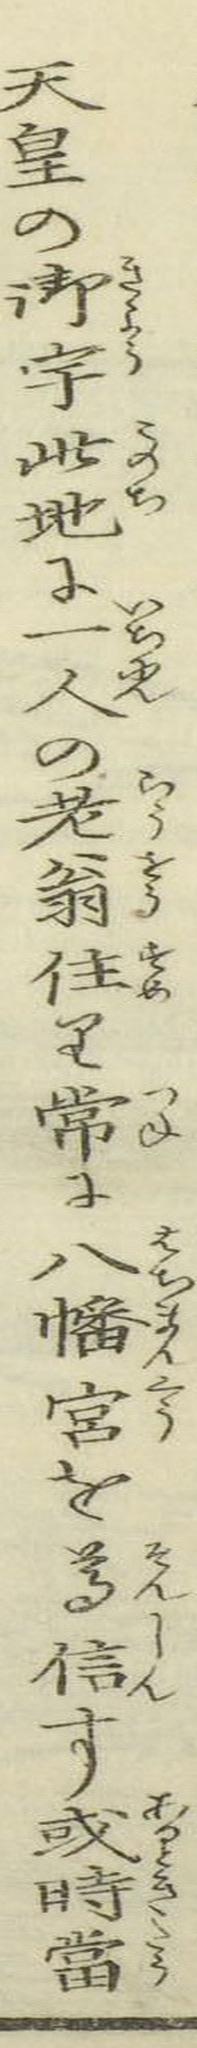天皇の御宇此地に一人の老翁住り常に八幡宮を尊信す或時当
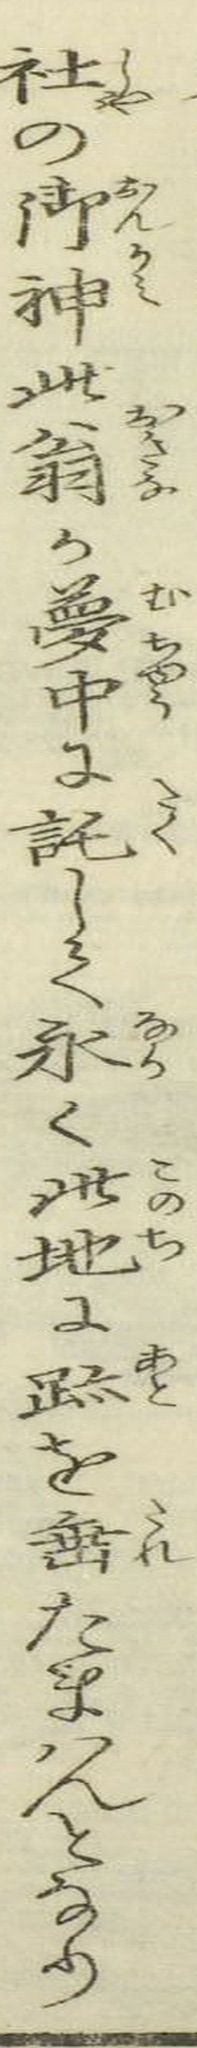社の御神此翁か夢中に託して永く此地に跡を垂たまはんとなり
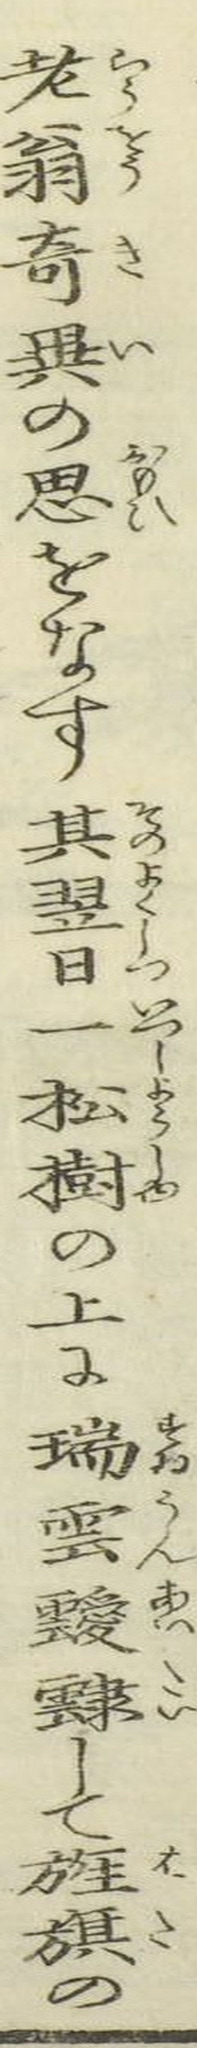老翁奇異の思をなす其翌日一松樹の上に瑞雲靉靆して旌旗の
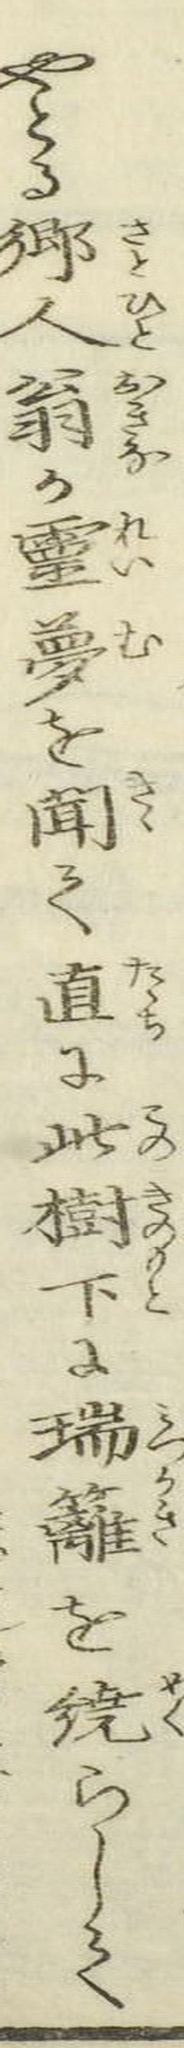やとる郷人翁か霊夢を聞て直に此樹下に瑞籬を繞らして
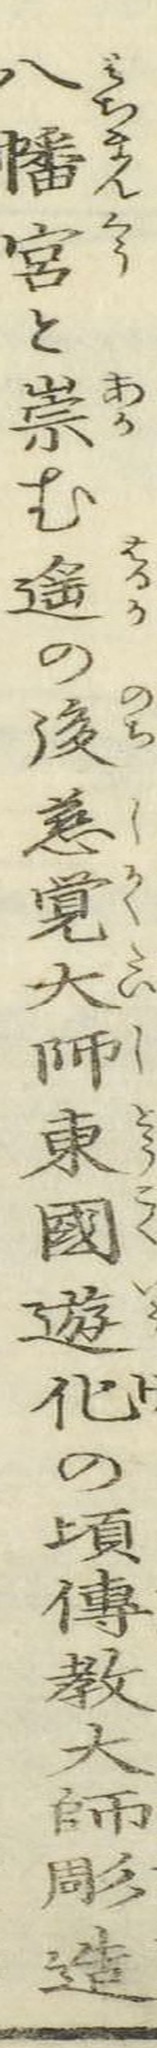八幡宮と崇む遥の後慈覚大師東国遊化の頃伝教大師彫造
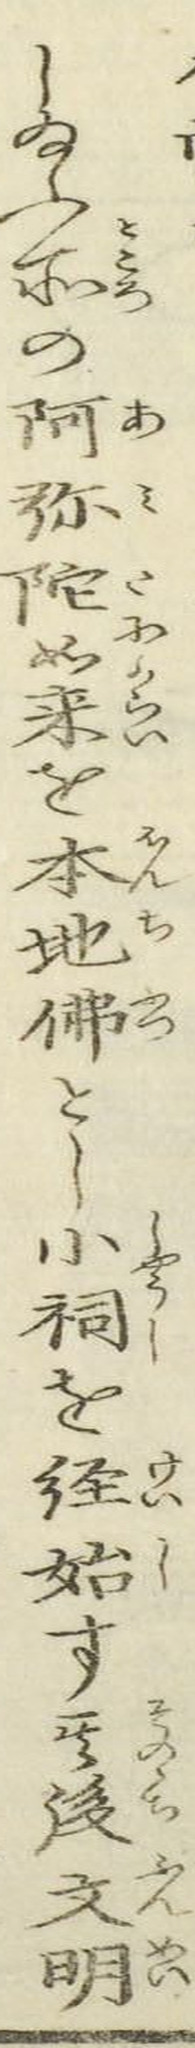し給ふ所の阿弥陀如来を本地仏とし小祠を経始す其後文明
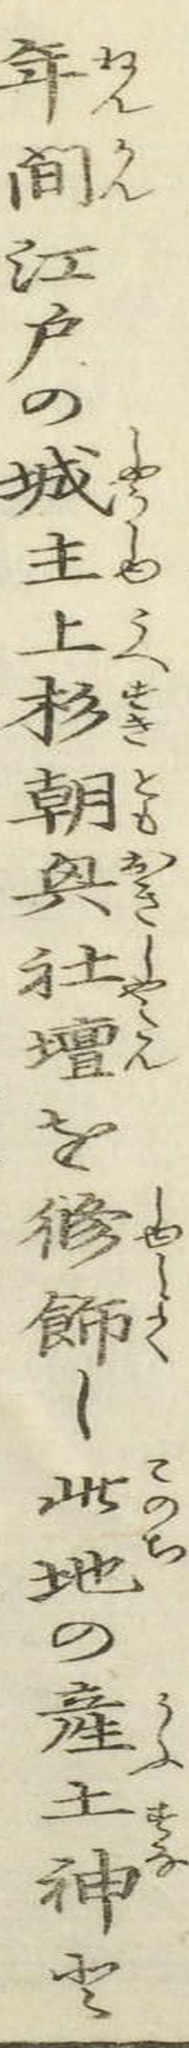年間江戸の城主上杉朝興社壇を修飾し此地の産土神と
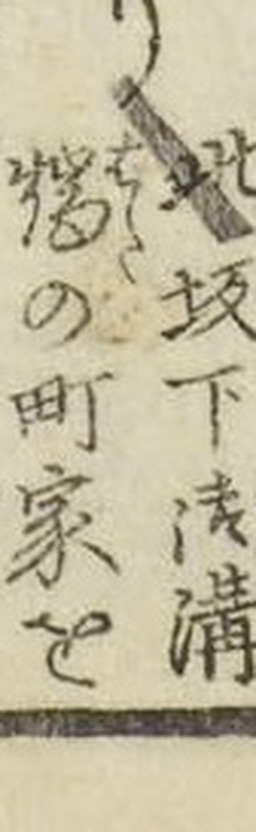端の町家を
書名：江戸名所図会 20巻 巻之11
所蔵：東京学芸大学教育コンテンツアーカイブ
